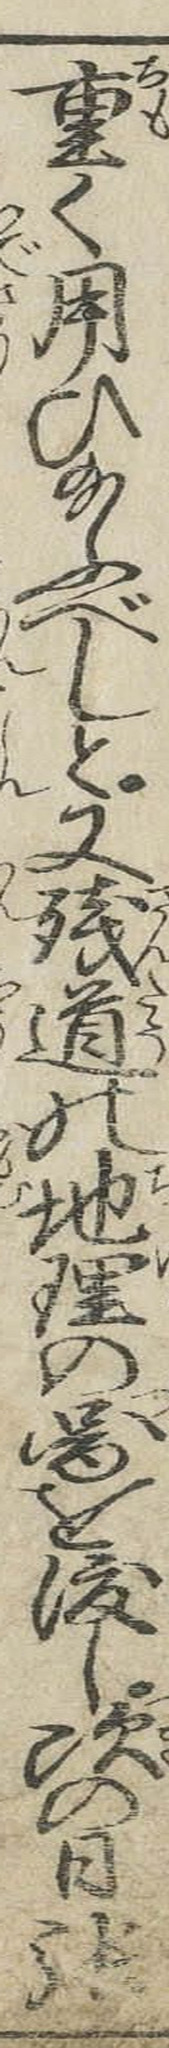重く用ひ給ふべしと。又残道の地理の図を渡し。次の日張
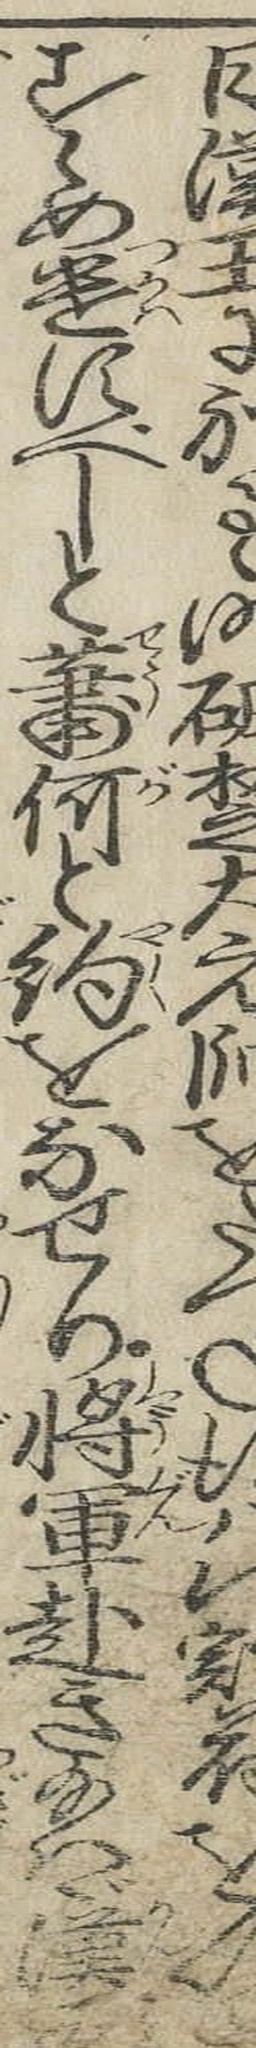すゝめ遣すべしと蕭何と約をなせり。将軍赴き給はゞ漢王
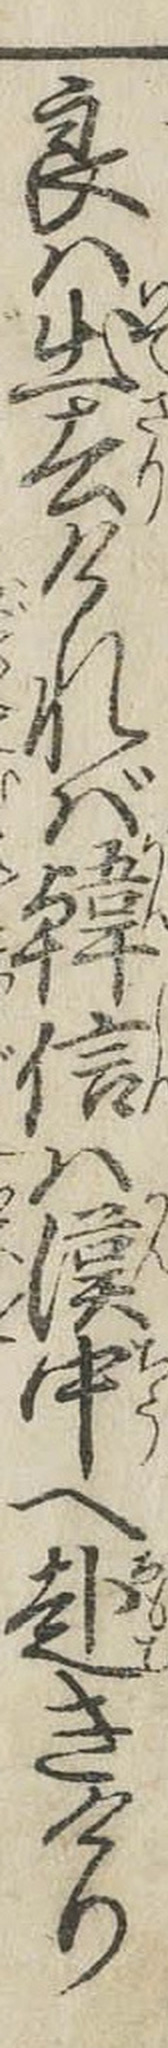良は出去ければ韓信は漢中へ赴きけり
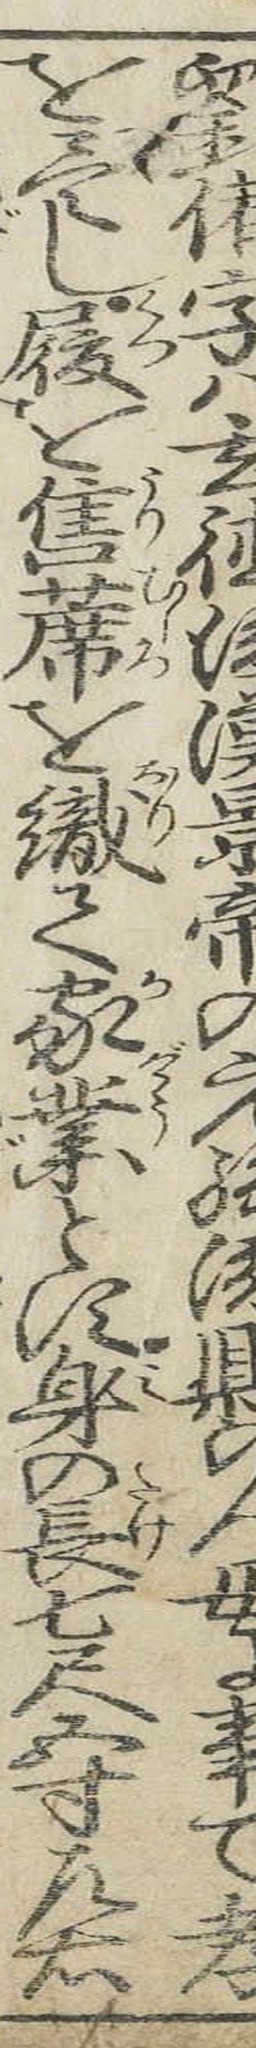を尽し。履を售蓆を織て家業とす。身の長七尺五寸左右
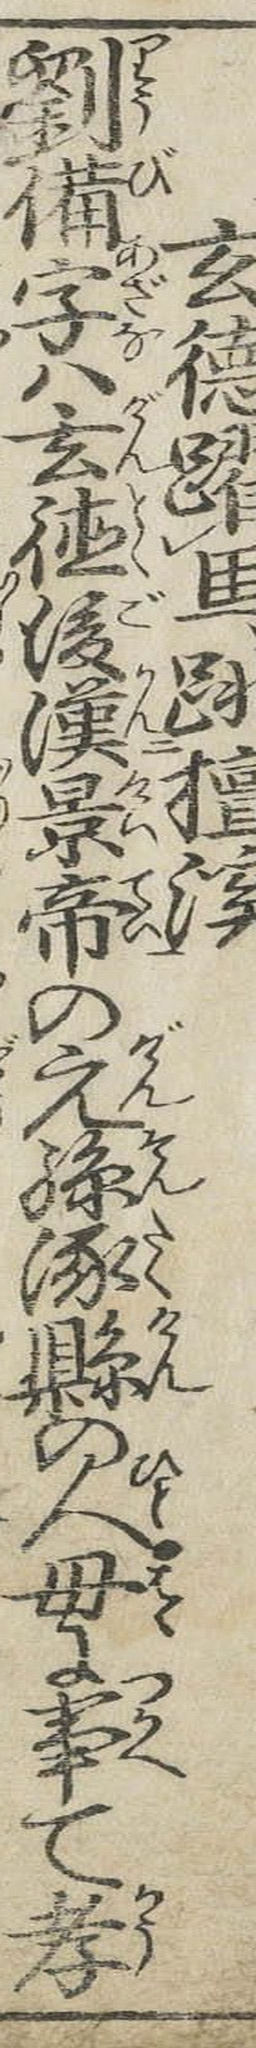劉備字は玄徳後漢景帝の元孫涿縣の人。母に事て孝
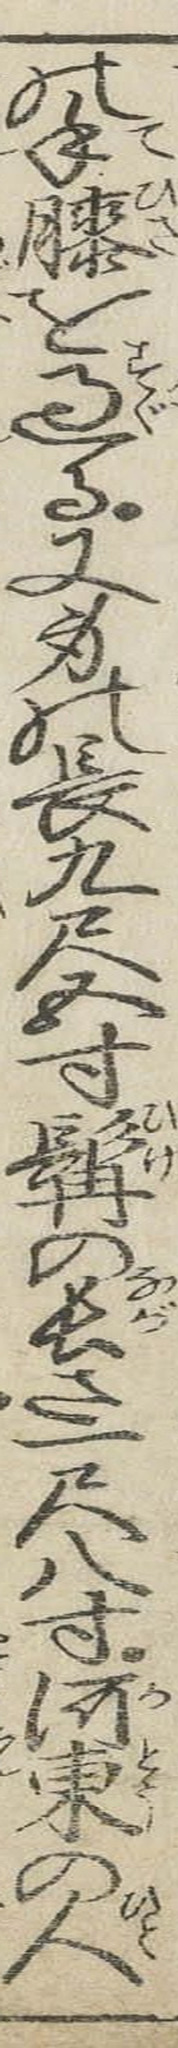の手膝を過る。又身の長九尺五寸髯の長さ一尺八寸。河東の人
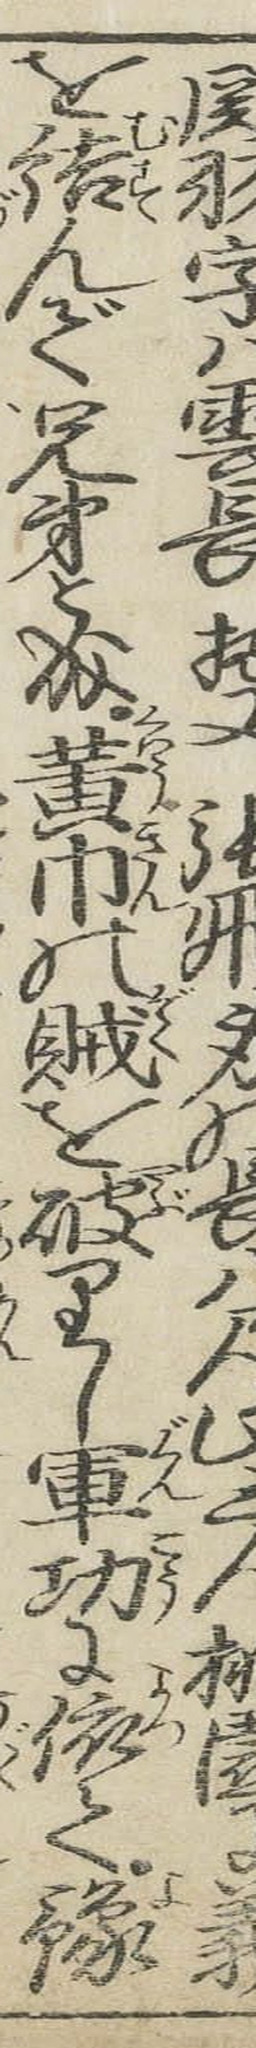を結んで兄弟と成。黄巾の賊を破りし軍功に依て。予
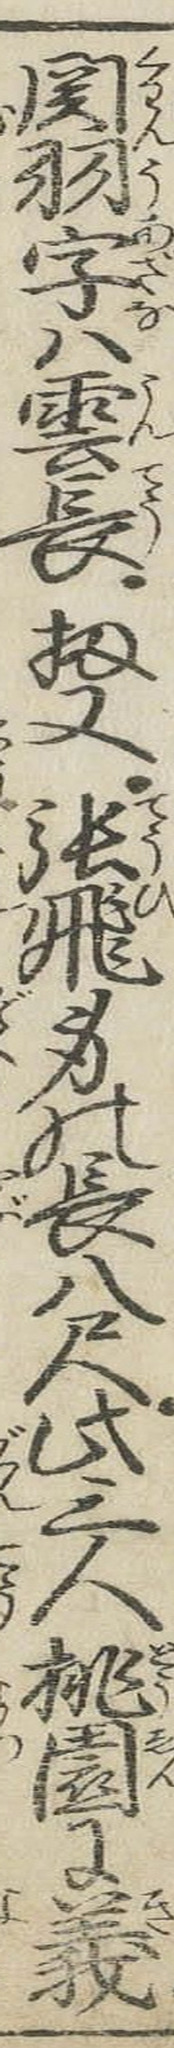関羽字は雲長。扨又。張飛身の長八尺。此三人桃園に義
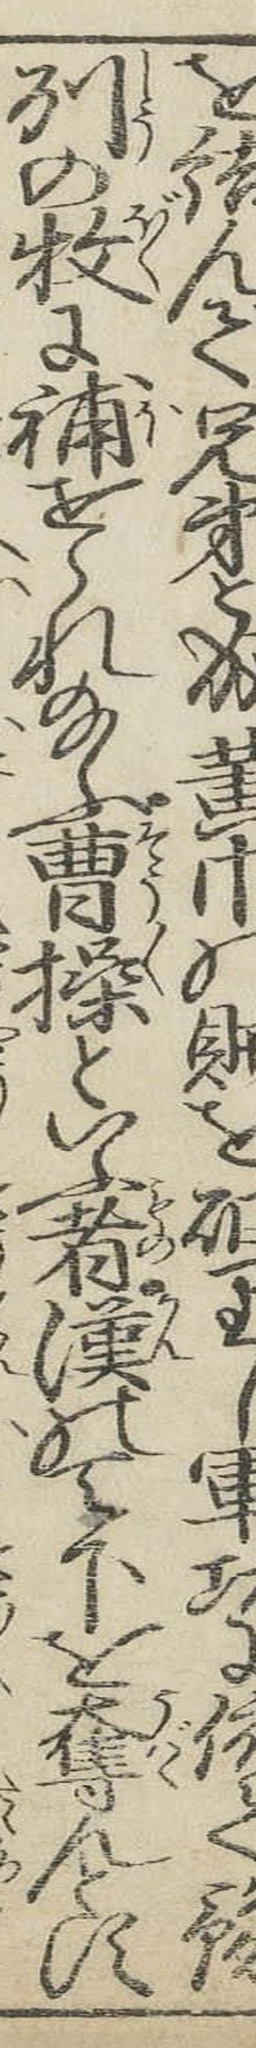州の牧に補せられ給ふ。曹操といふ者。漢の天下を奪んとす
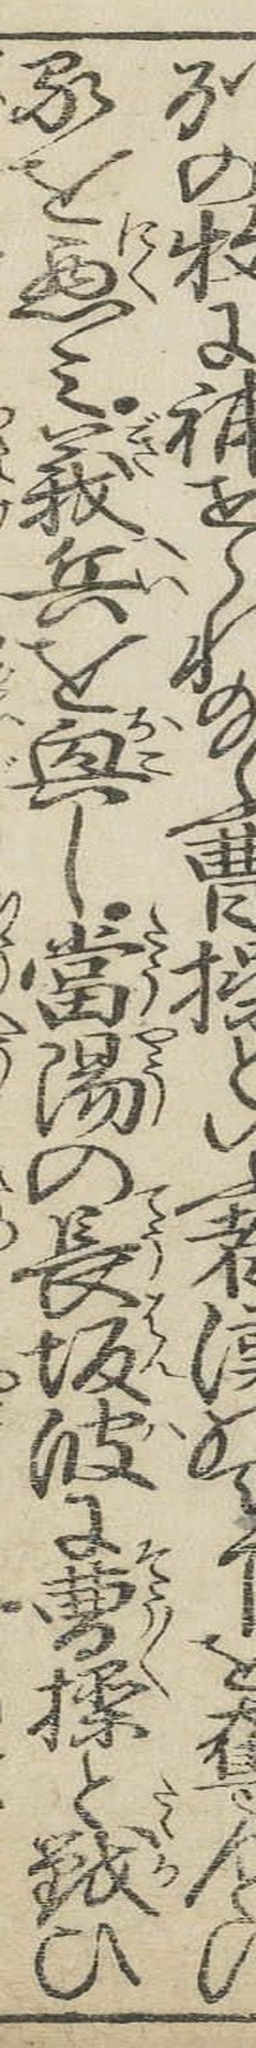るを悪み。義兵を興し。当陽の長坂波に曹操と戦ひ
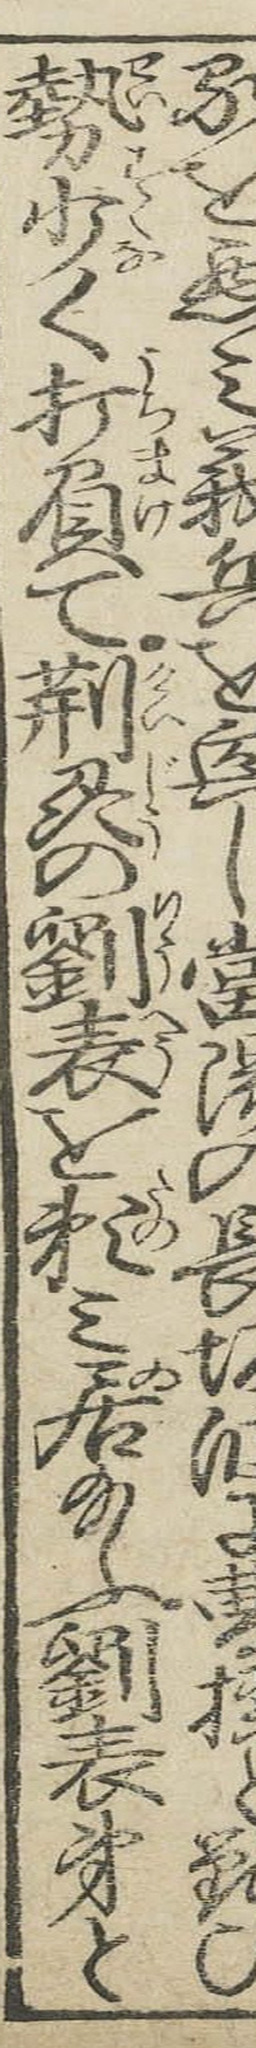勢少く打負て。荊州の劉表を頼み居給ふ。劉表弟と
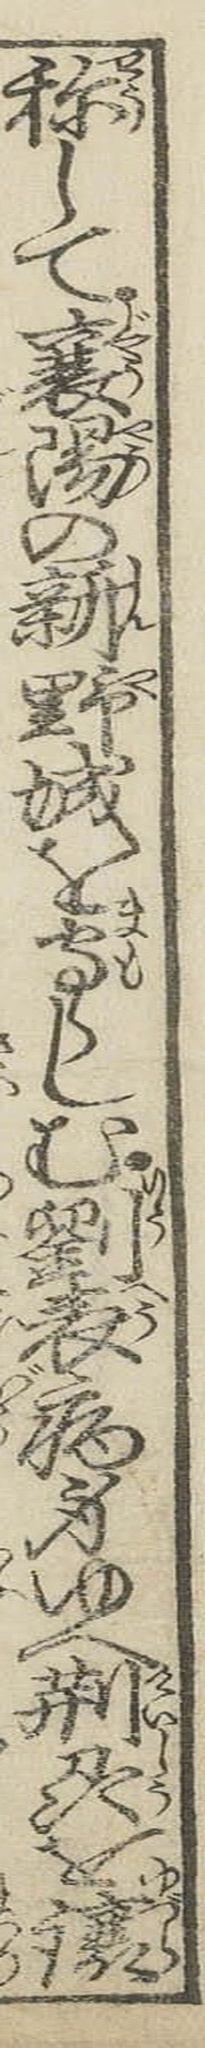称して。襄陽の新野城を守らしむ。劉表病身ゆへ荊州を譲
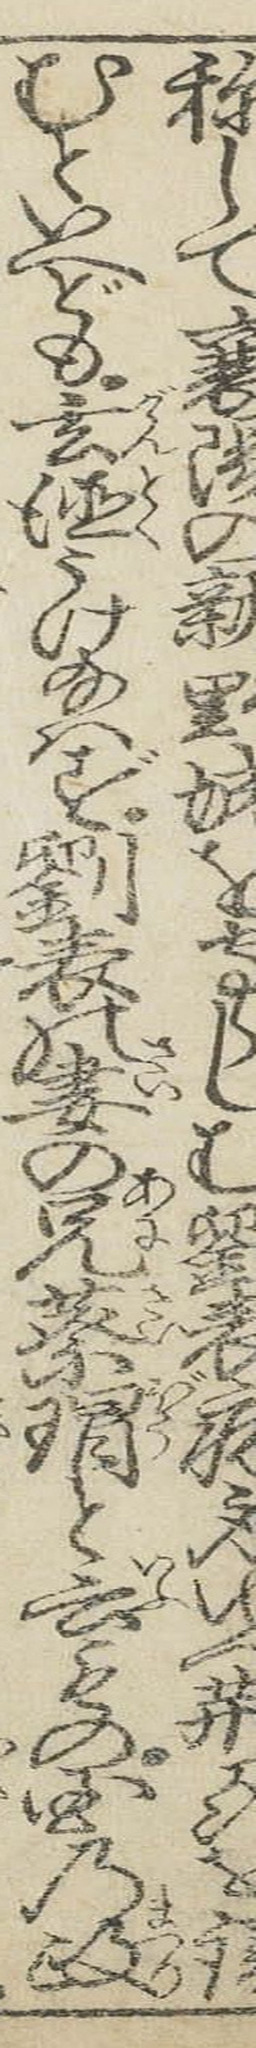むといへども。玄徳うけ給はず。劉表の妻の兄蔡瑁と云もの。国の政
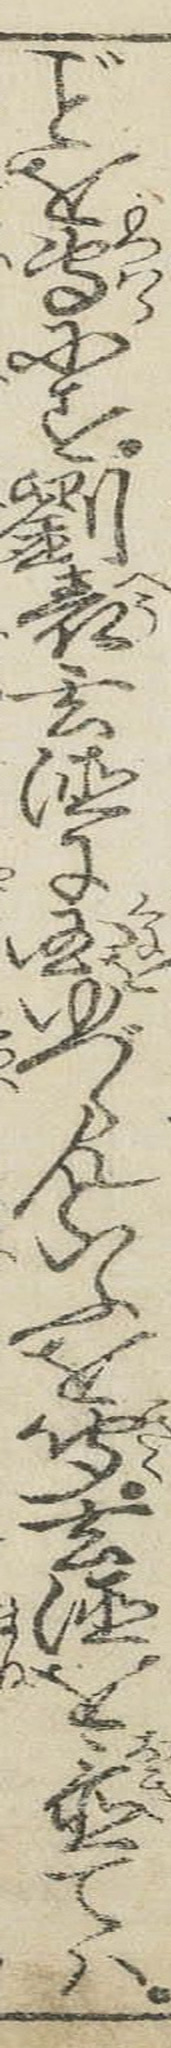ごとを専にす。劉表玄徳に国をゆづらんといふを聞。玄徳を置ては。
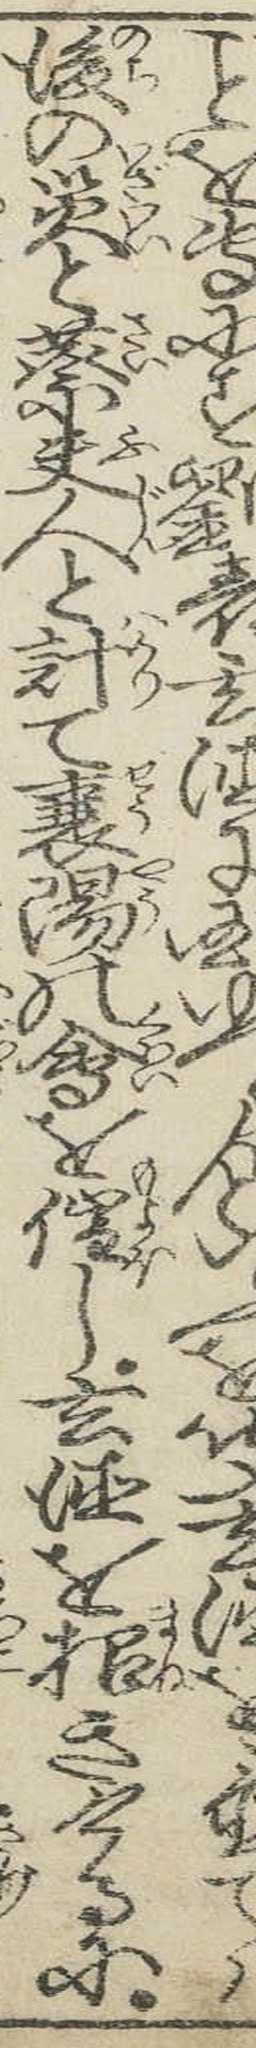後の災と蔡夫人と計て襄陽の会を催し。玄徳を招きけるに。
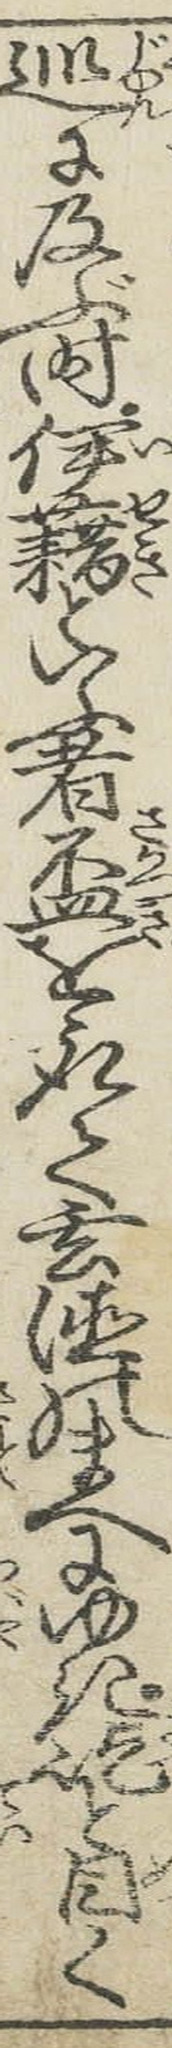巡に及ぶ時。伊藉といふ者盃を取て玄徳のまへにゆき。屹と目く
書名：絵本写宝袋 9巻 7之巻
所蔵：東京学芸大学教育コンテンツアーカイブ
